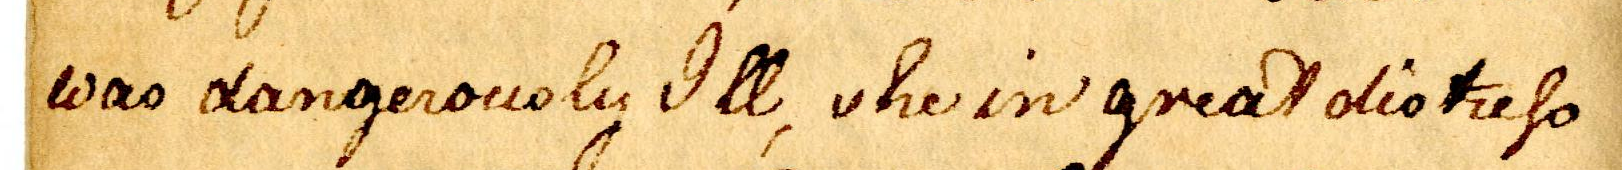was dangerously Ill, she in great distress
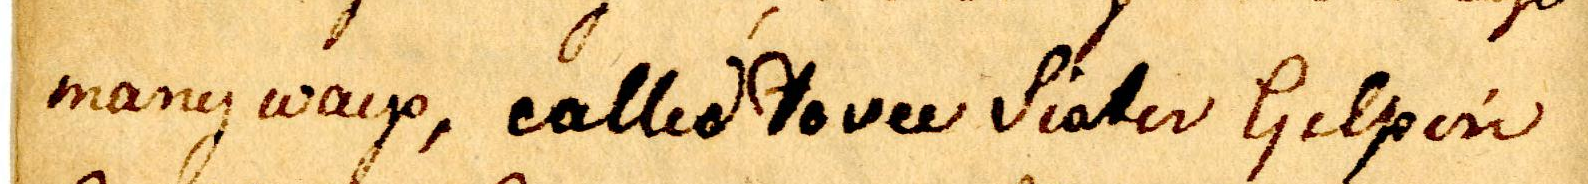many ways, called to see Sister Gilpin
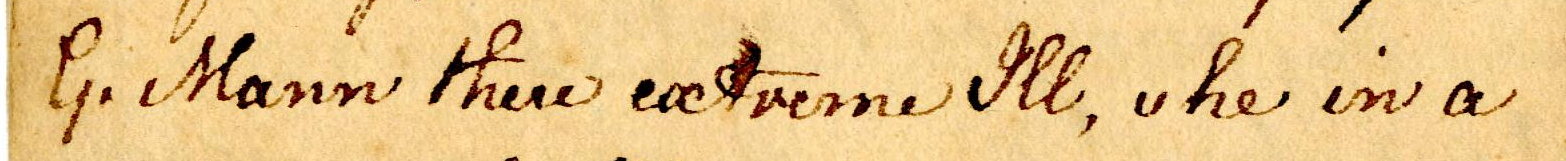G. Mann there extreme Ill, she in a
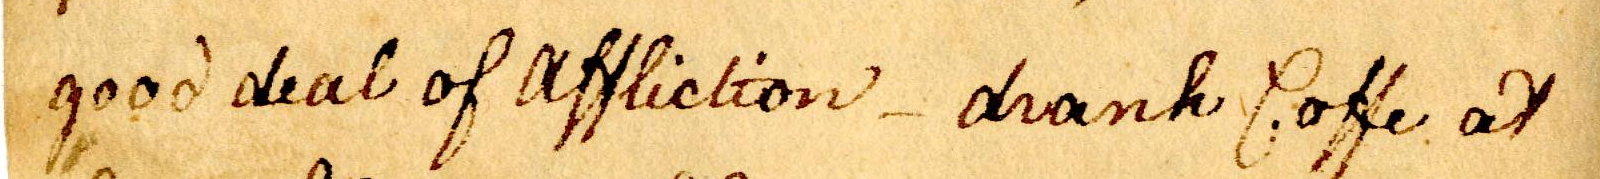good deal of Affliction- drank Coffe at
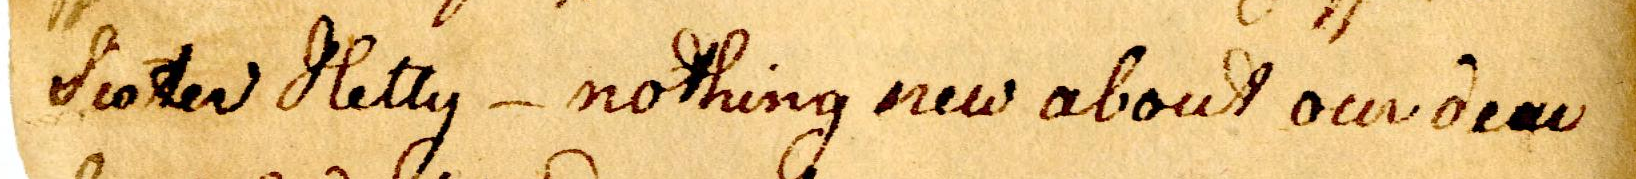Sister Hetty- nothing new about our dear
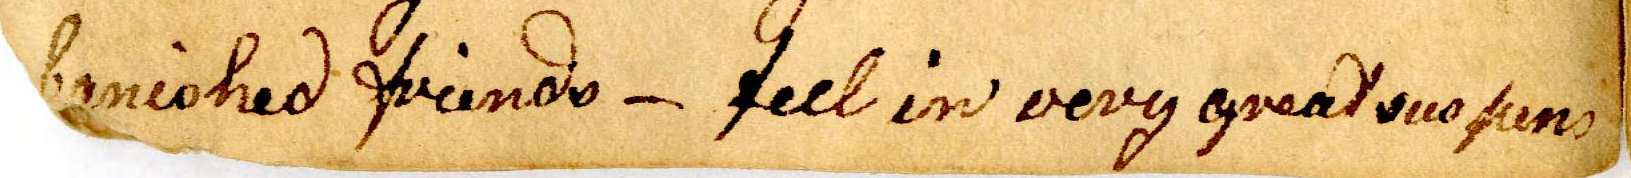banished friends- feel in very great suspens
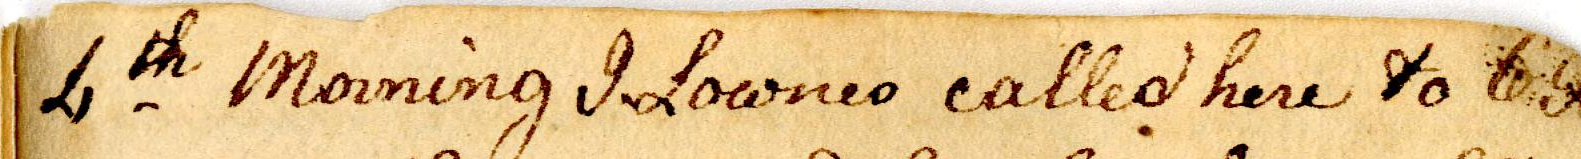4^th Morning I Lownes called here to
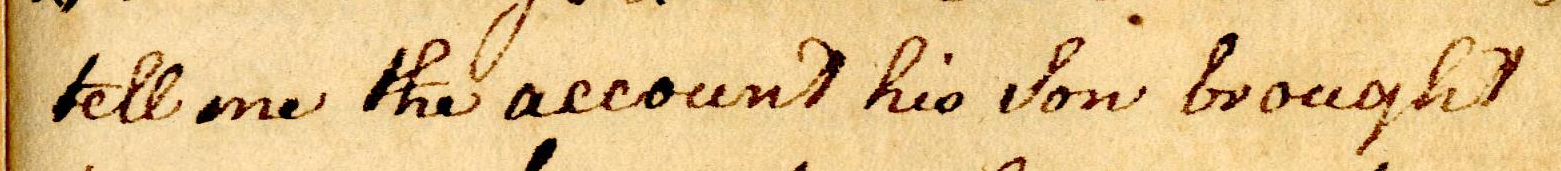tell me the account his Son brought
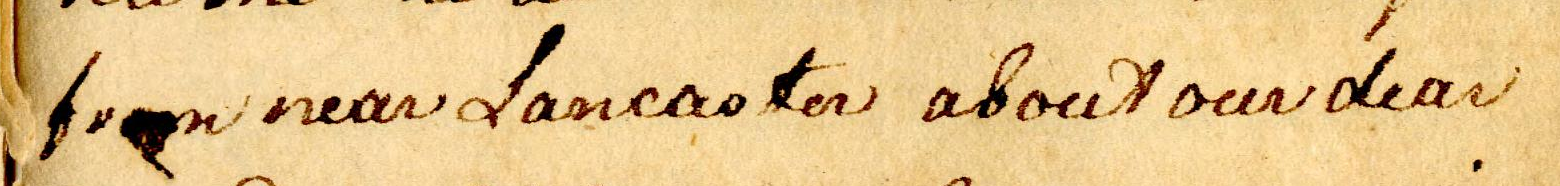from near Lancaster about our dear
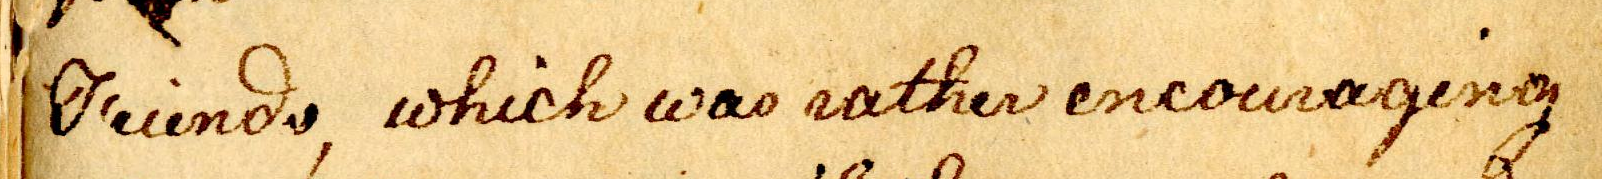Friends, which was rather encouraging
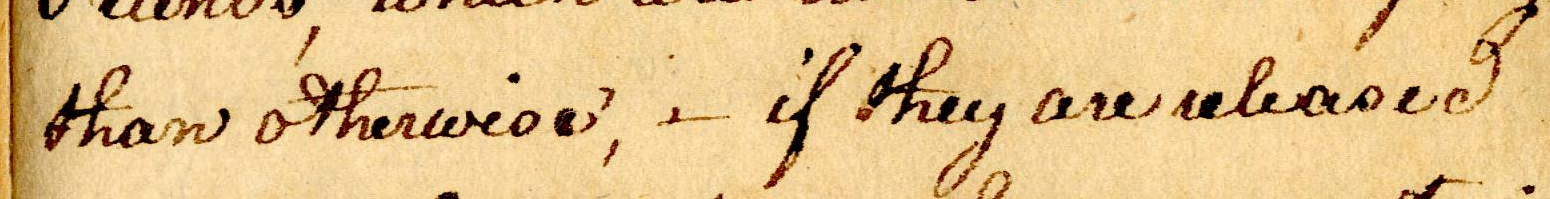than otherwise- if they are released
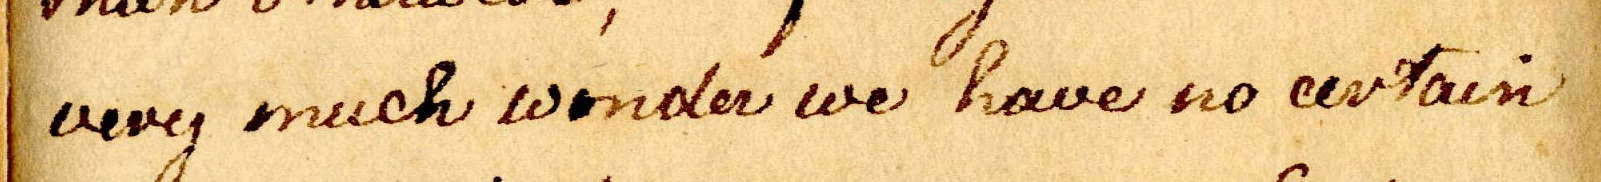very much wonder we have no certain
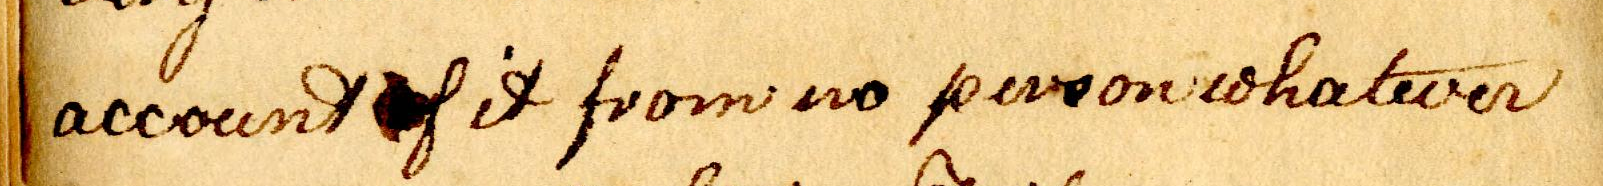account of it from no person whatever
